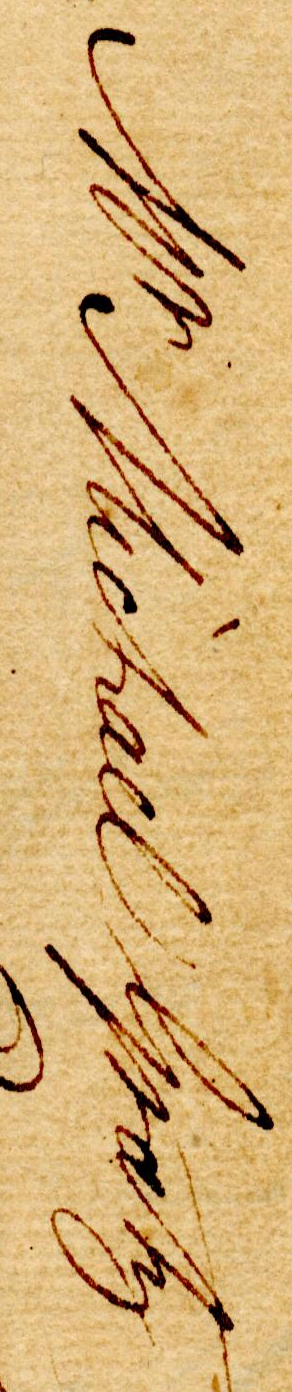M^r Michael Gratz
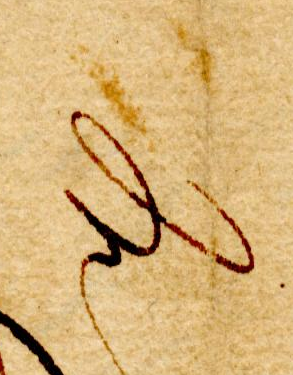In
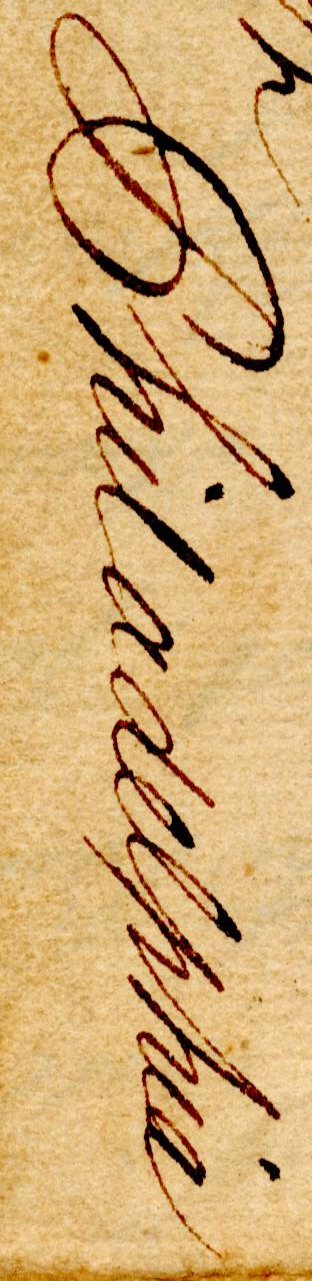Philadelphia
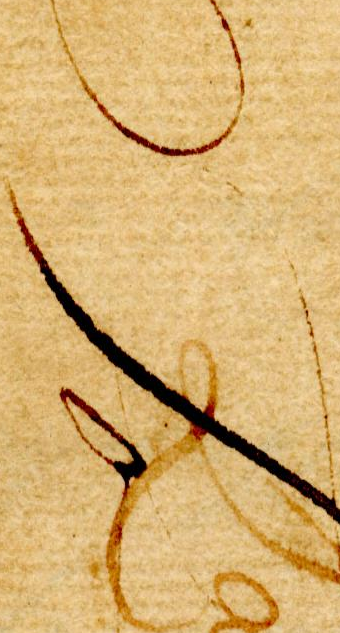To
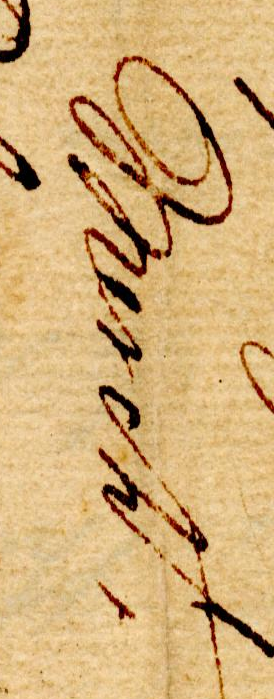Merch^t.
